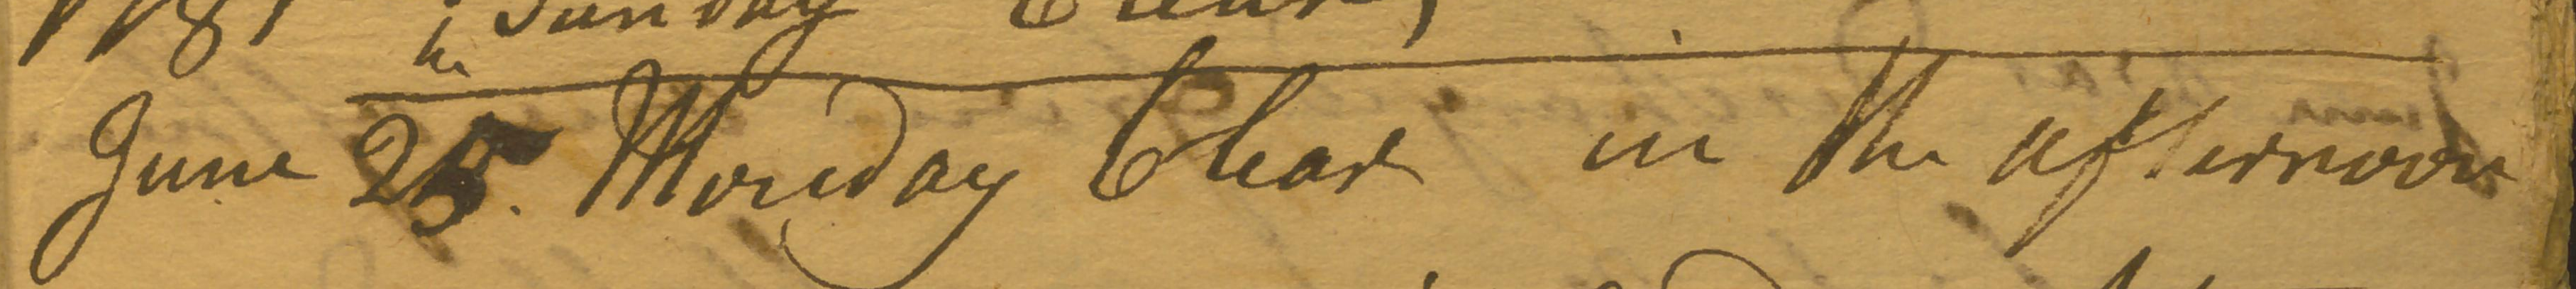yune 25. Monday Clear in the afternoon
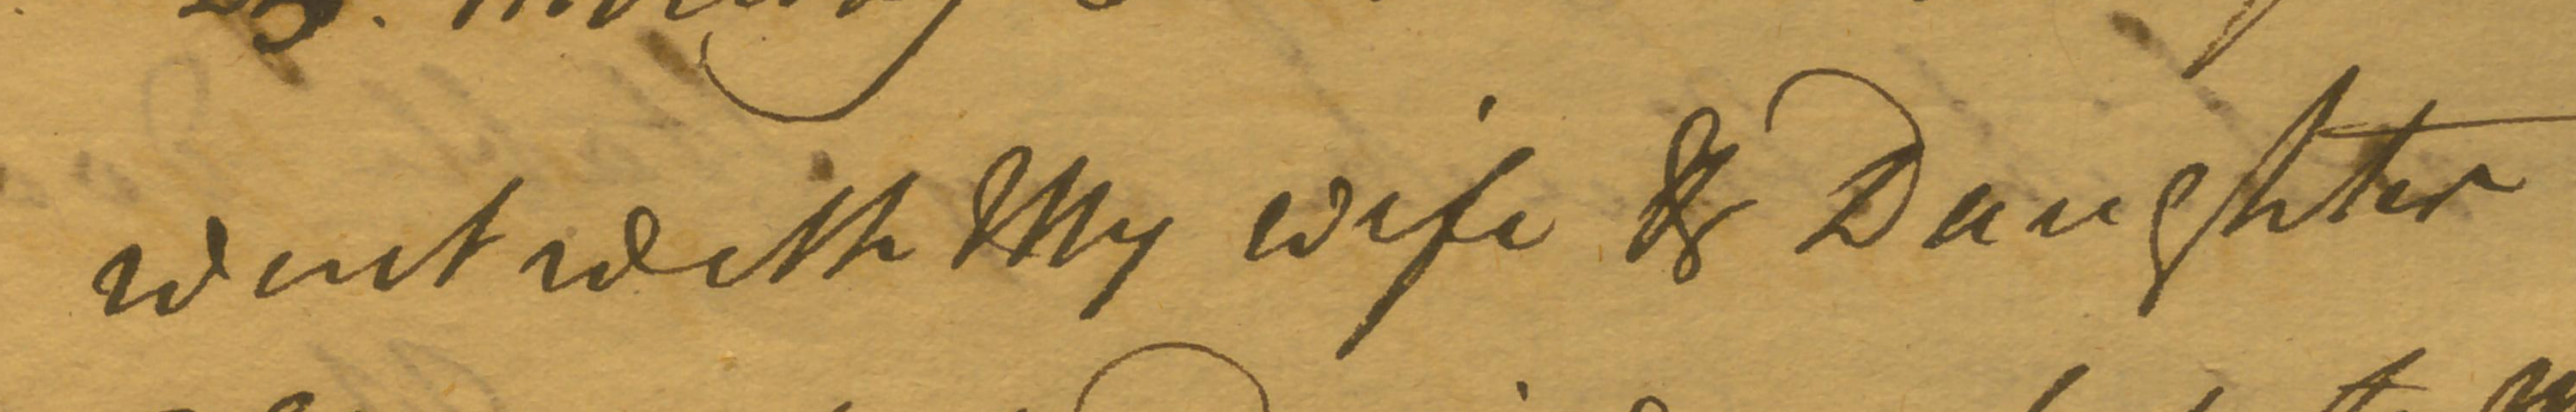went with My wife & Daughter
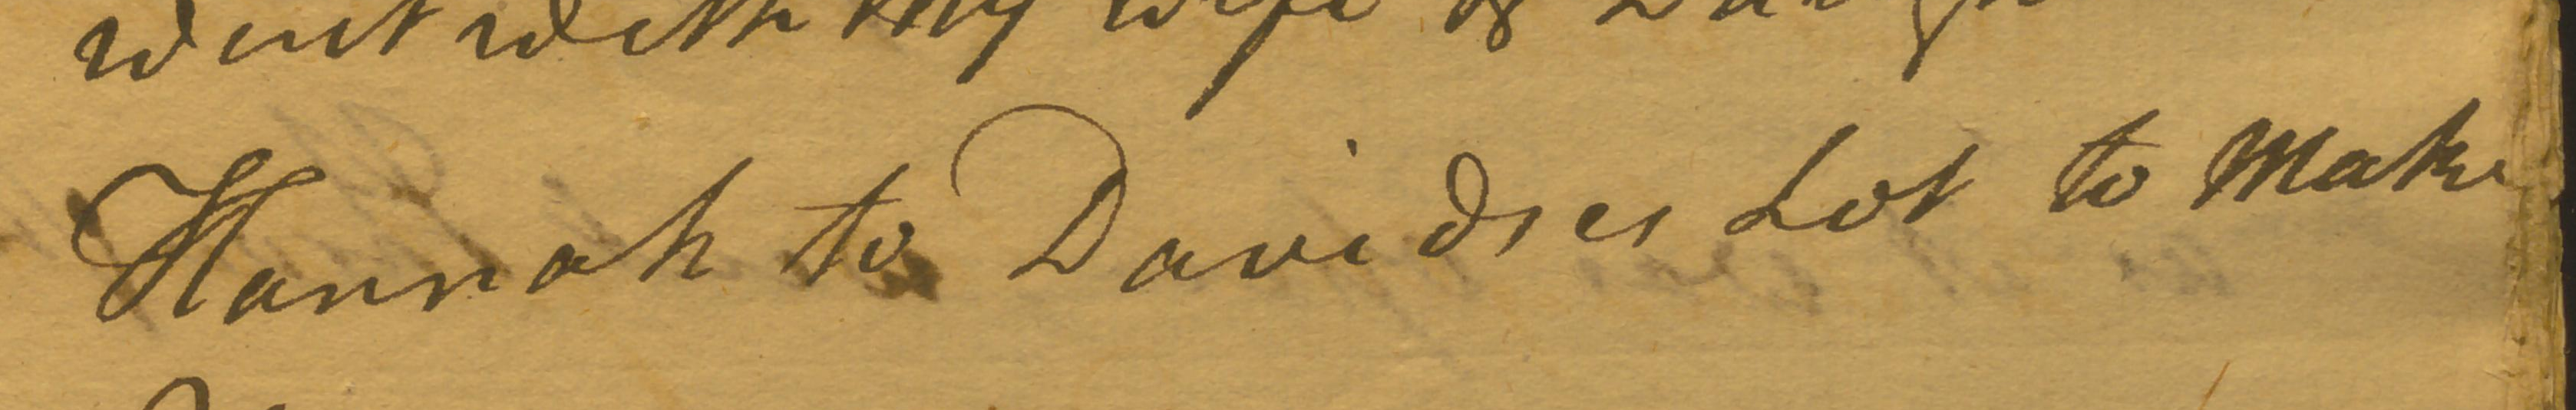Hannah to Davidses Lot to Make
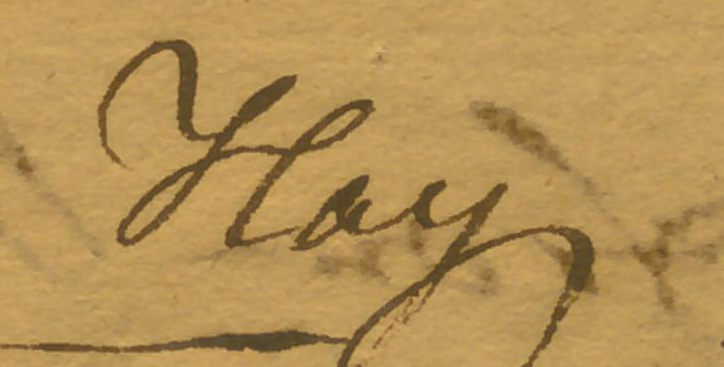Hlay
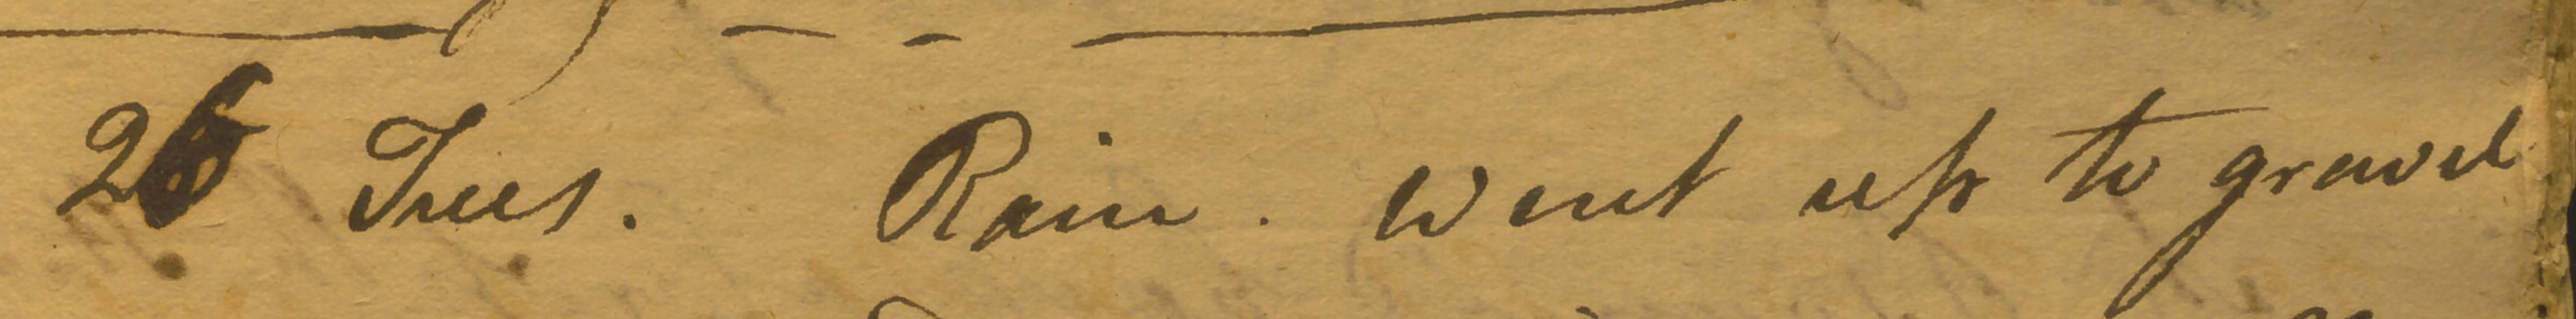26 Tues. Rain. went up to gravel
